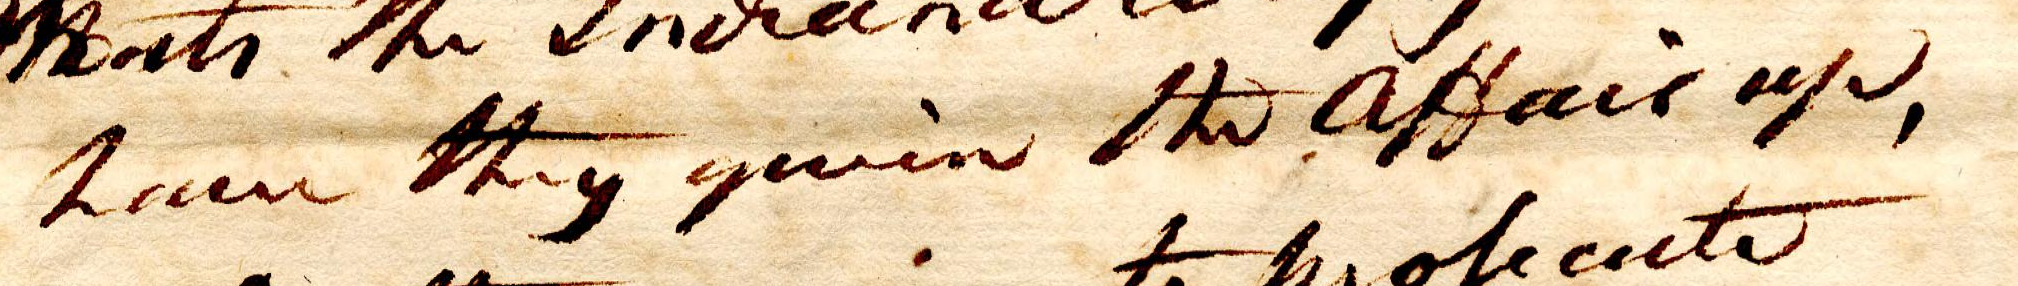have they givin the affais up,
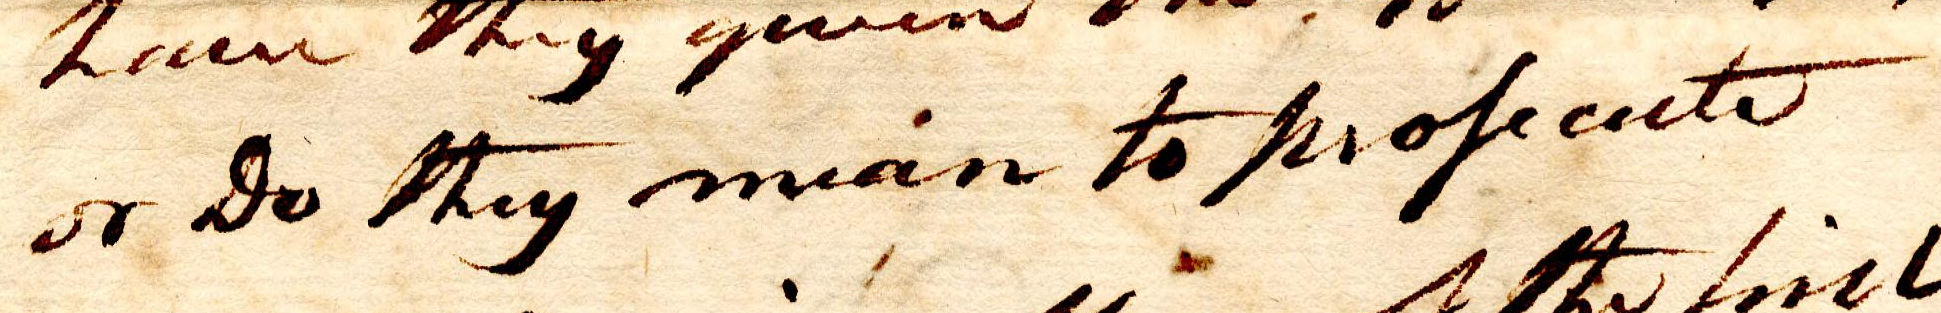or Do they mean to prosecute
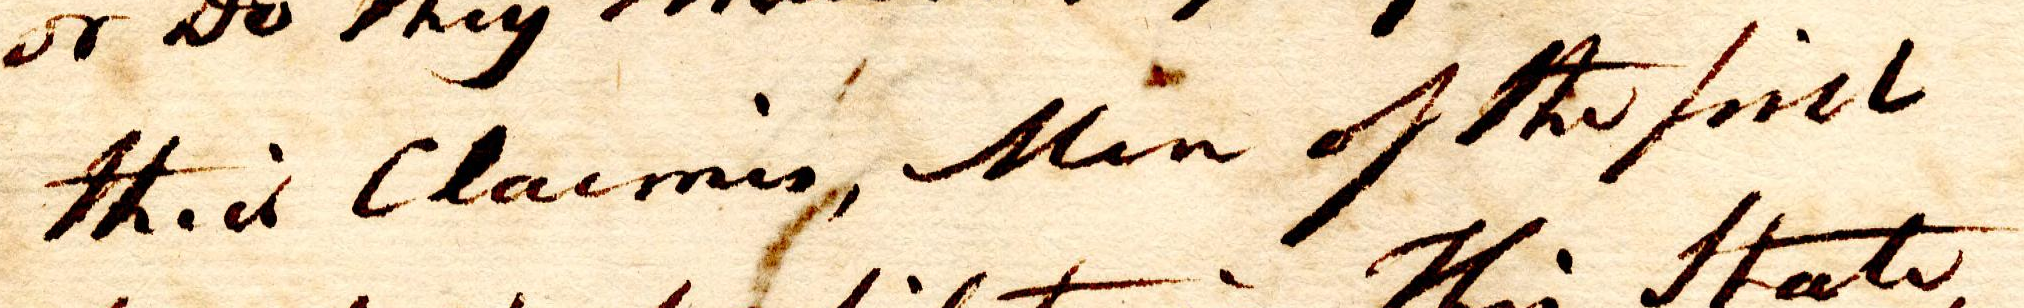their Claims, Men of the first
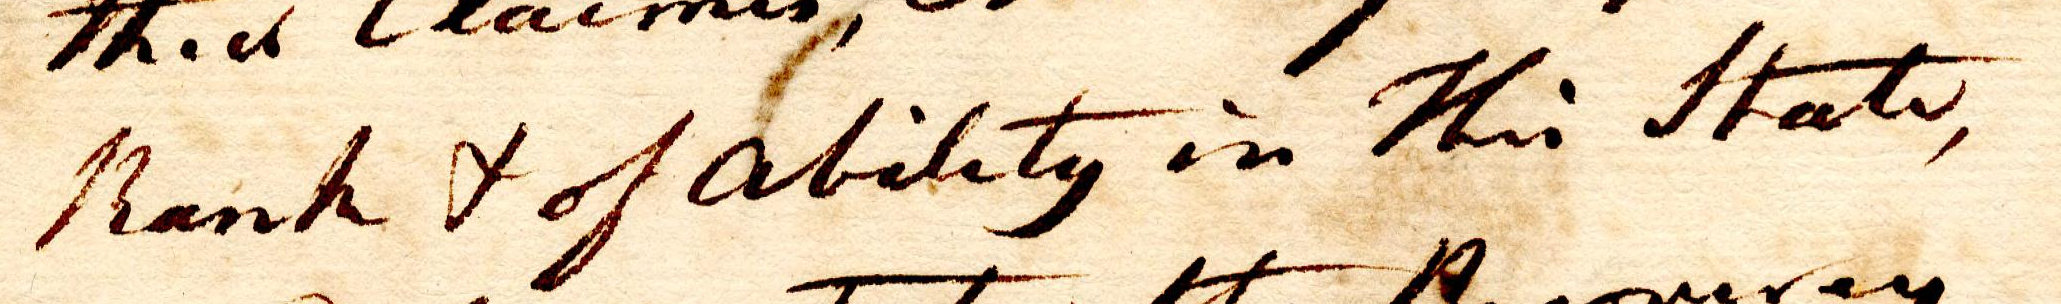Rank & of Ability in this state,
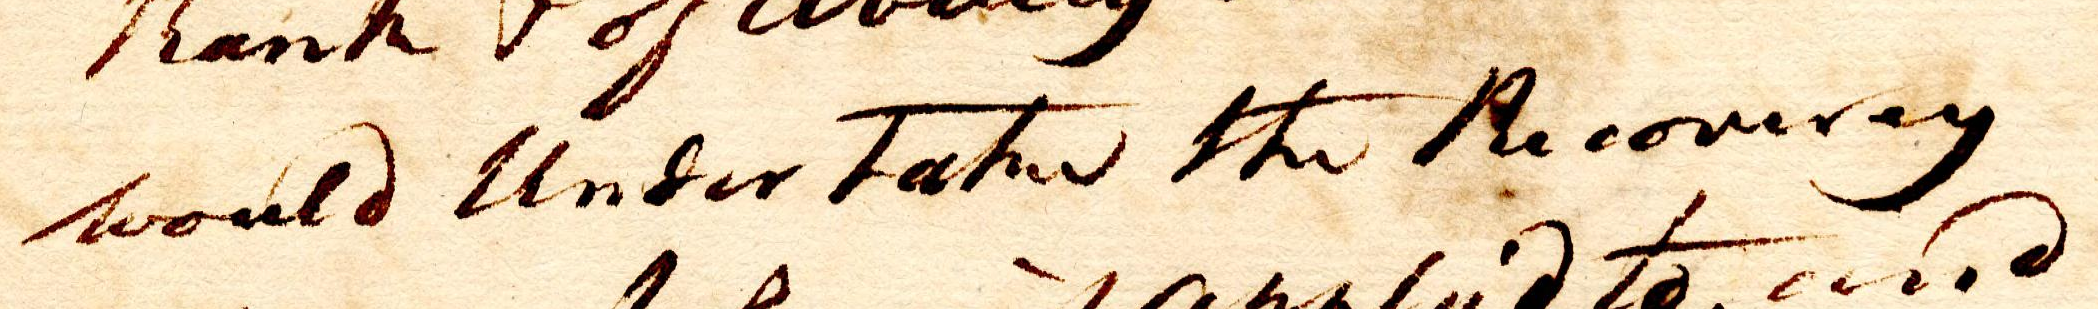would Undertake the Recoverey
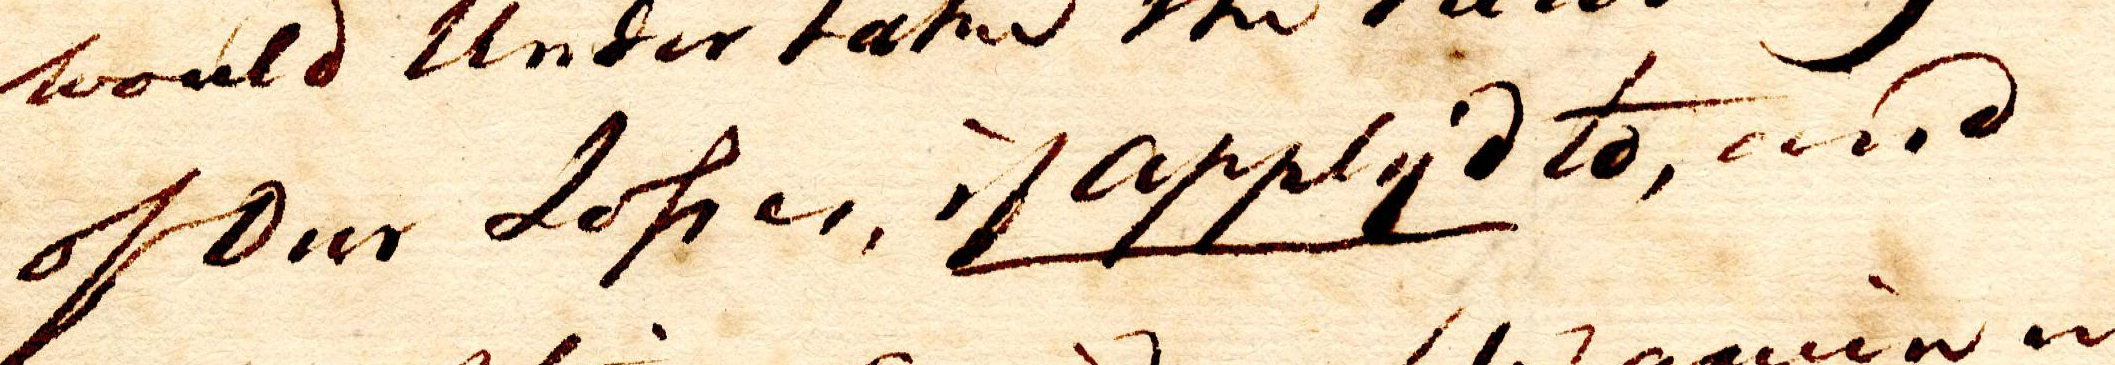of Our Losses if apply'd to, and
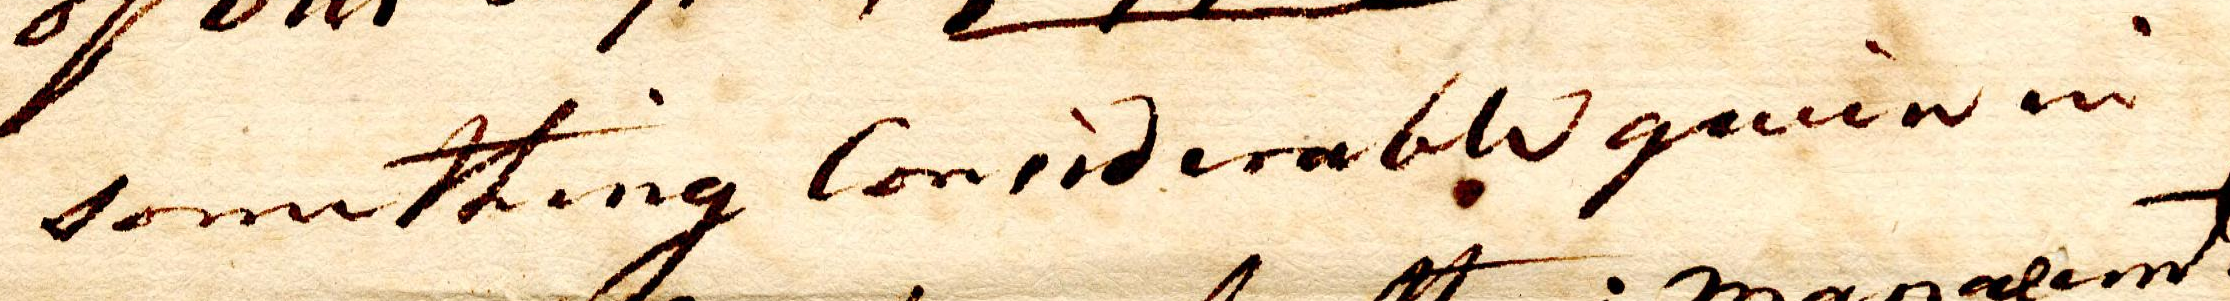something Considerable gain in
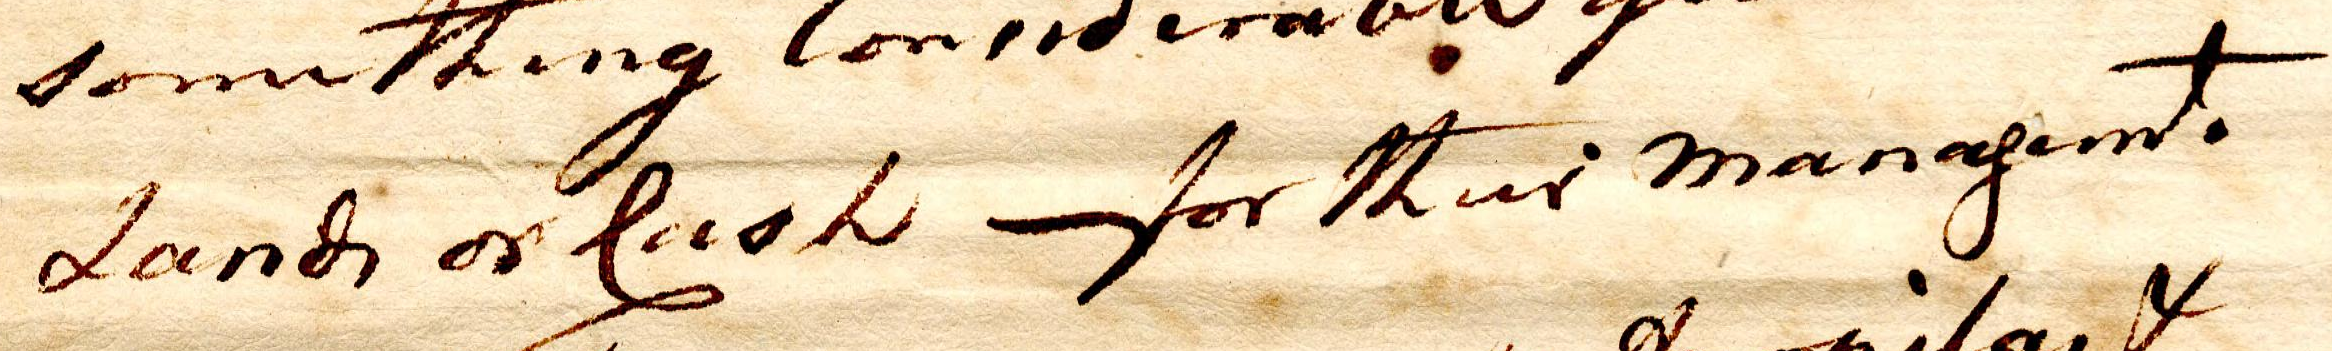Lands or Cash- for their managem^t.
